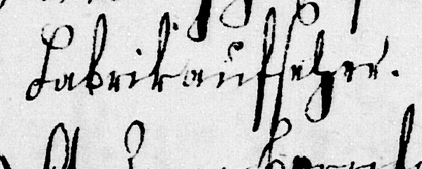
Fabrikaufseher.
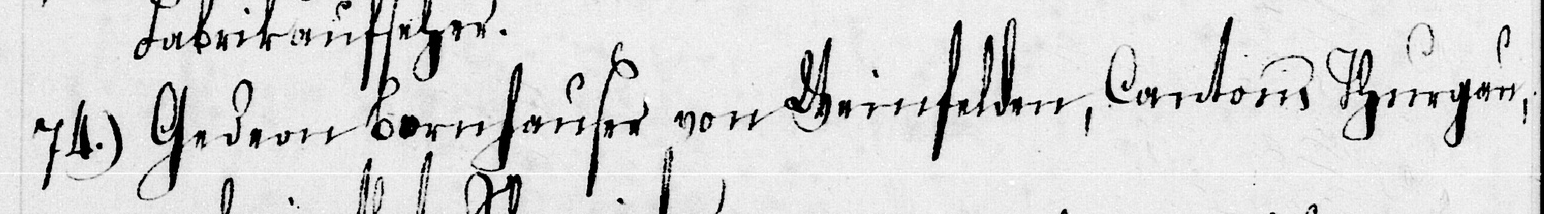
74.) Gedeon Bornhauser von Weinfelden, Cantons Thurgau,
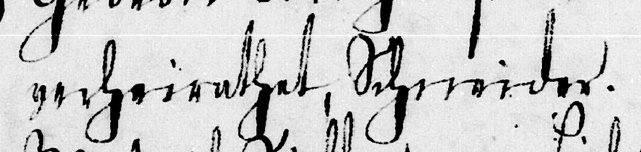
verheirathet, Schneider.
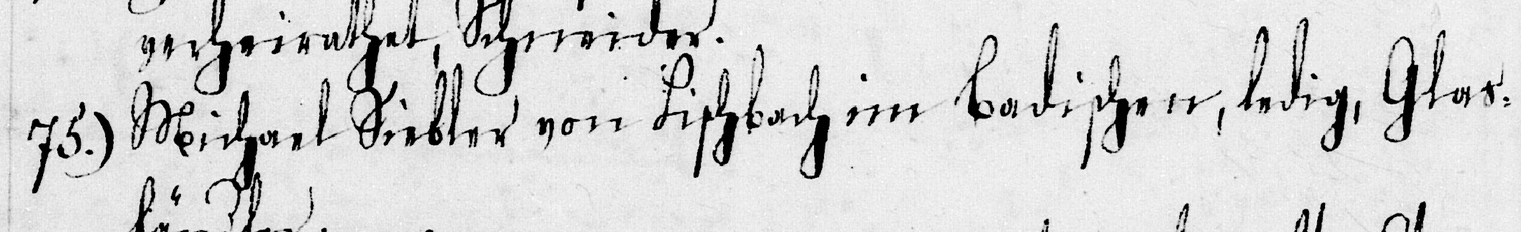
75.) Michael Siebler von Fischbach im Badischen, ledig, Glas¬
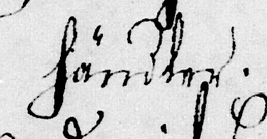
händler.
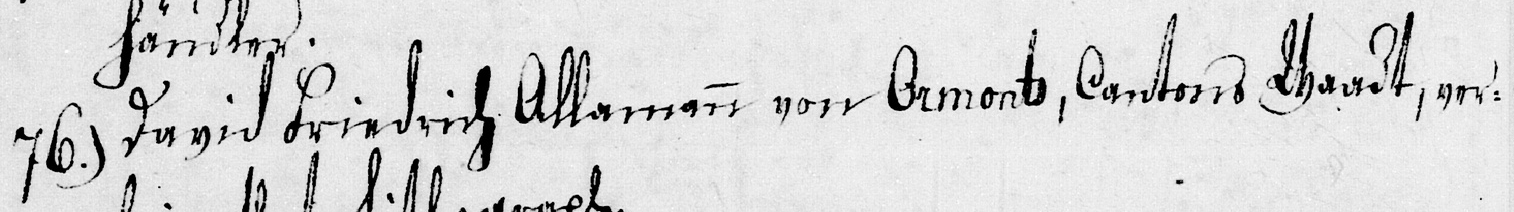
76.) David Friedrich Allamann von Ormonts, Cantons Waadt, ve¬
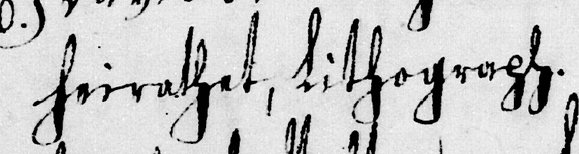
rheirathet, Lithograph.
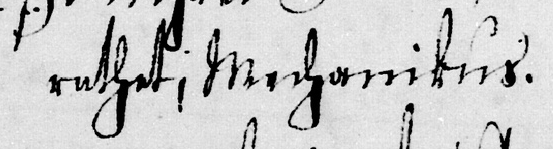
rathet, Mechanikus.
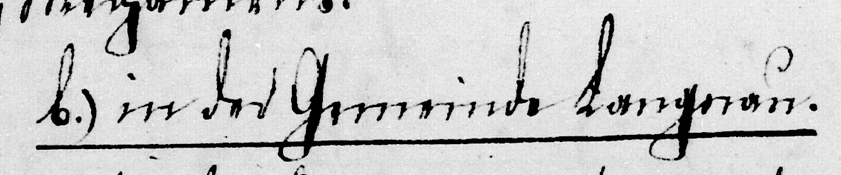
b.) in der Gemeinde Langnau.
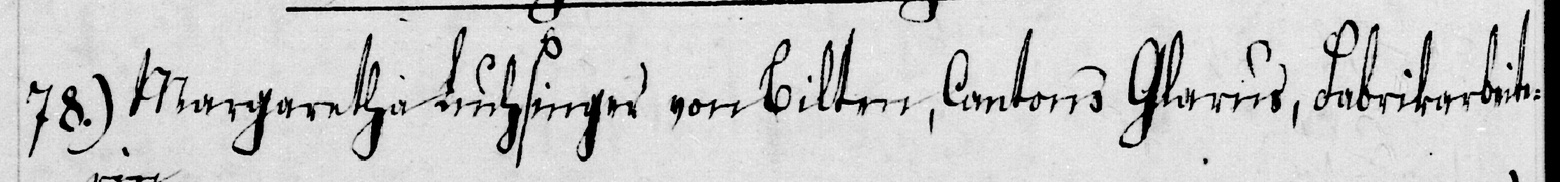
78.) Margaretha Luchsinger von Bilten, Cantons Glarus, Fabrikarbei¬
